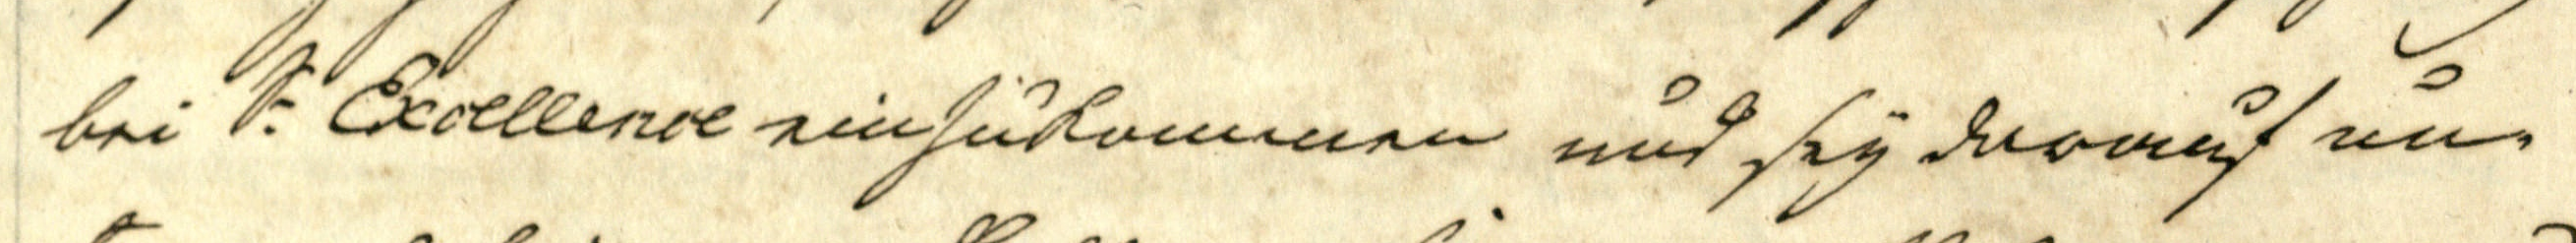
bei Sr Excellence einzukommen und seÿ darauf un¬
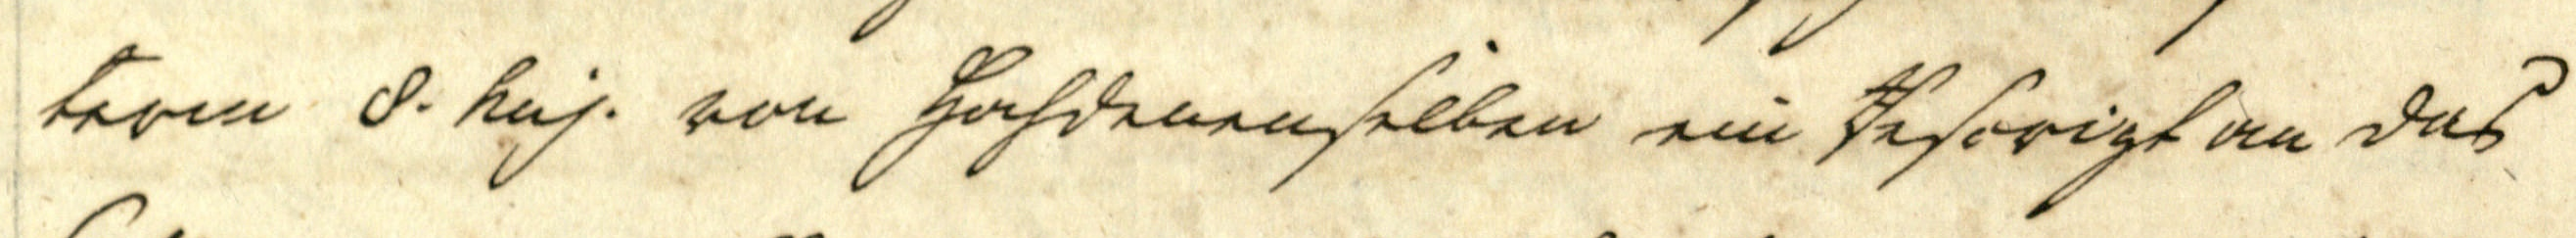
term 8. huj. von Hochdenenselben ein Rescript an das
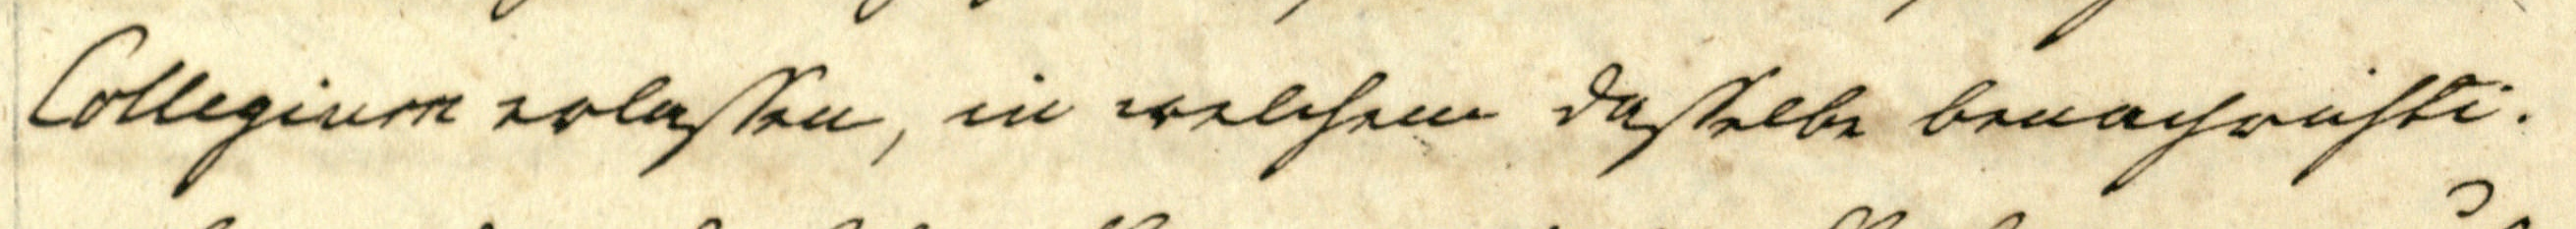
Collegium erlassen, in welchem dasselbe benachrichti¬
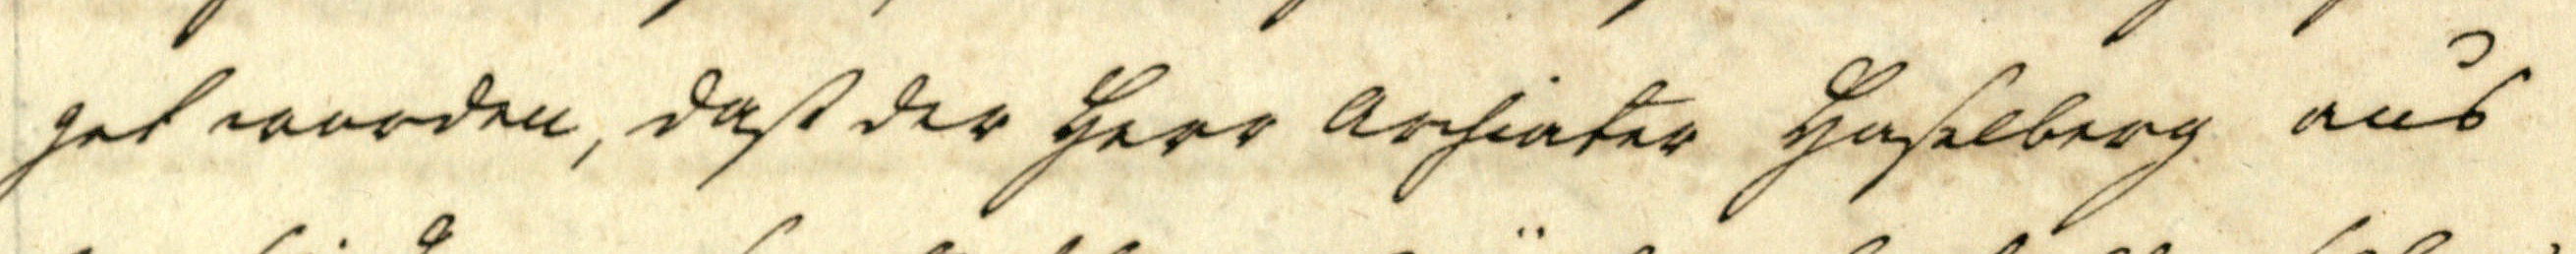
get worden, daß der Herr Archiater Haselberg aus
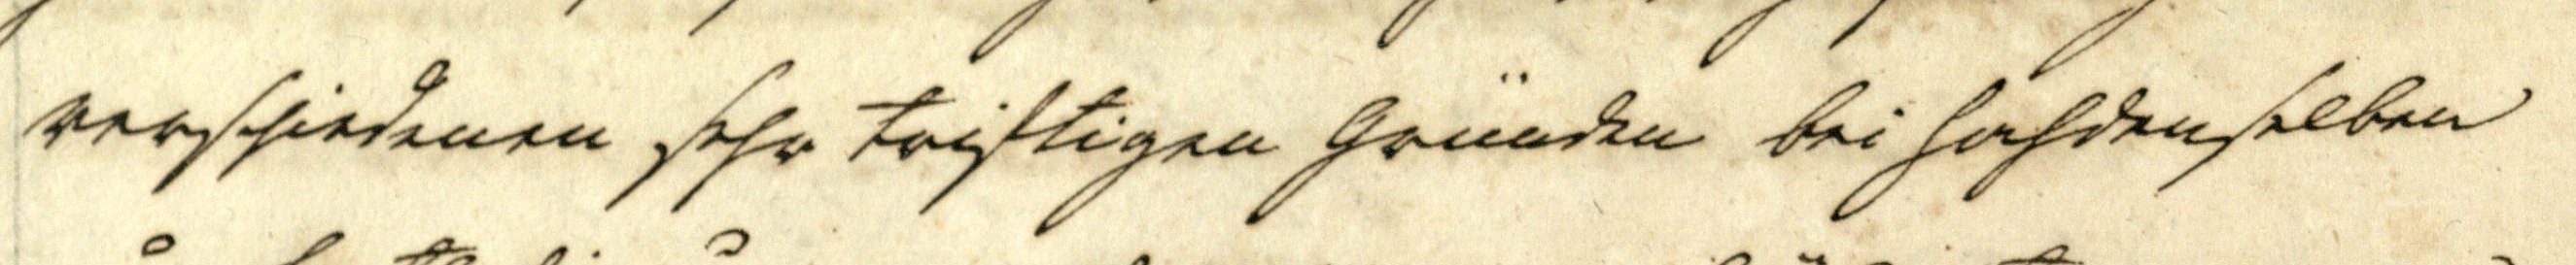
verschiedenen sehr triftigen Gründen bei Hochdenselben
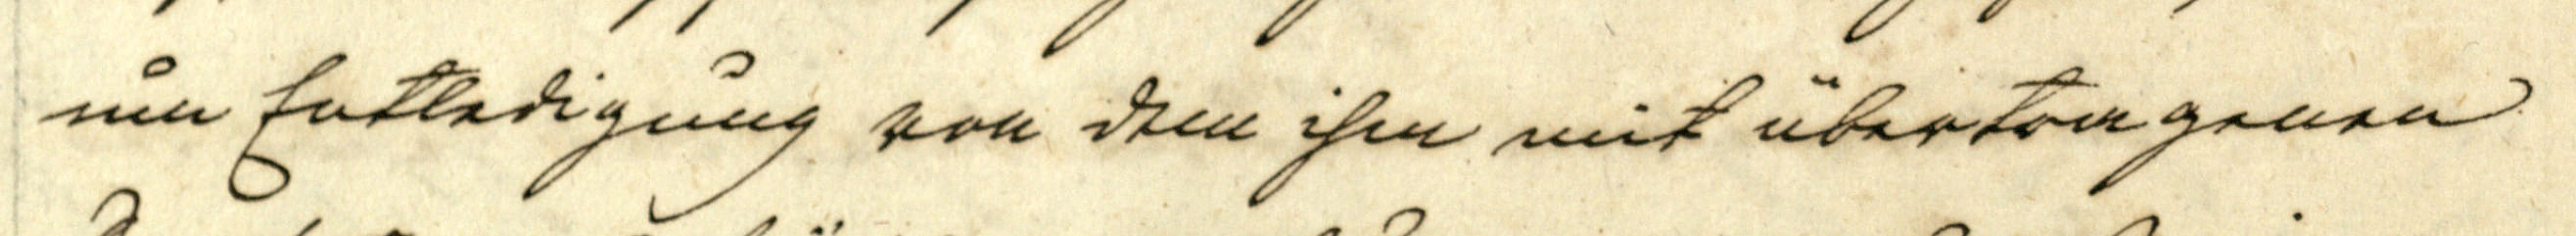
um Entledigung von dem ihm mit übertragenen
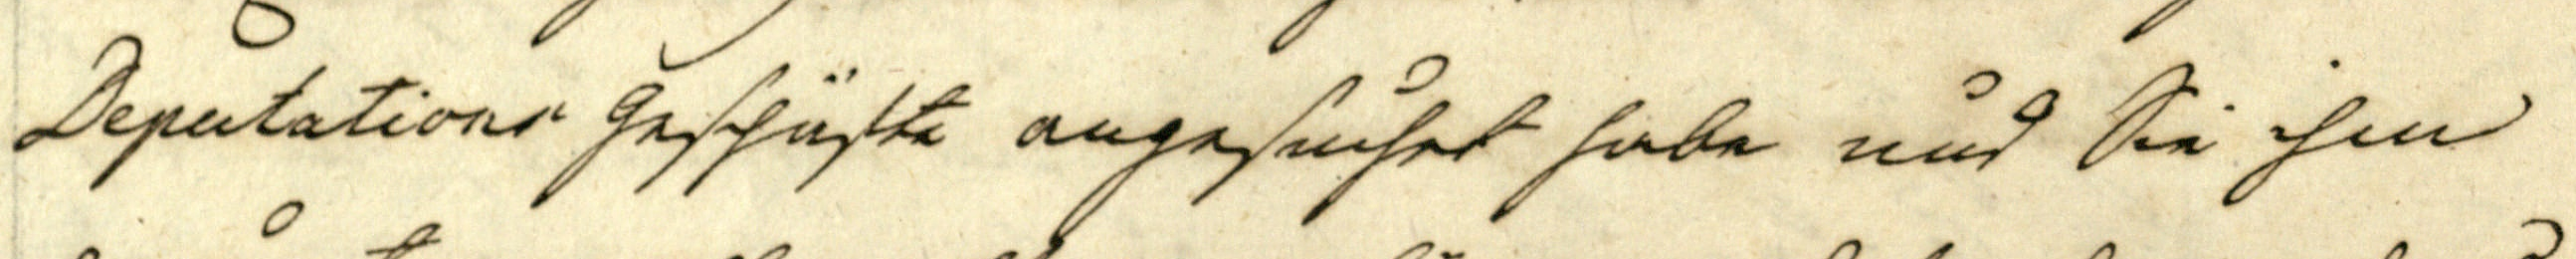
Deputations Geschäfte angesuchet habe und Sie ihm
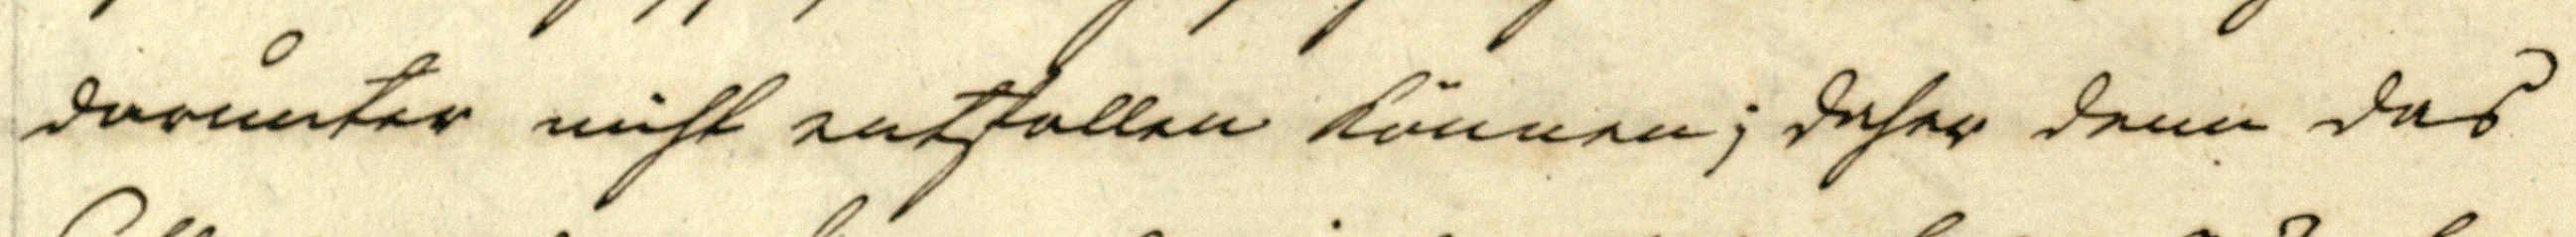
darunter nicht entfallen können; daher denn das
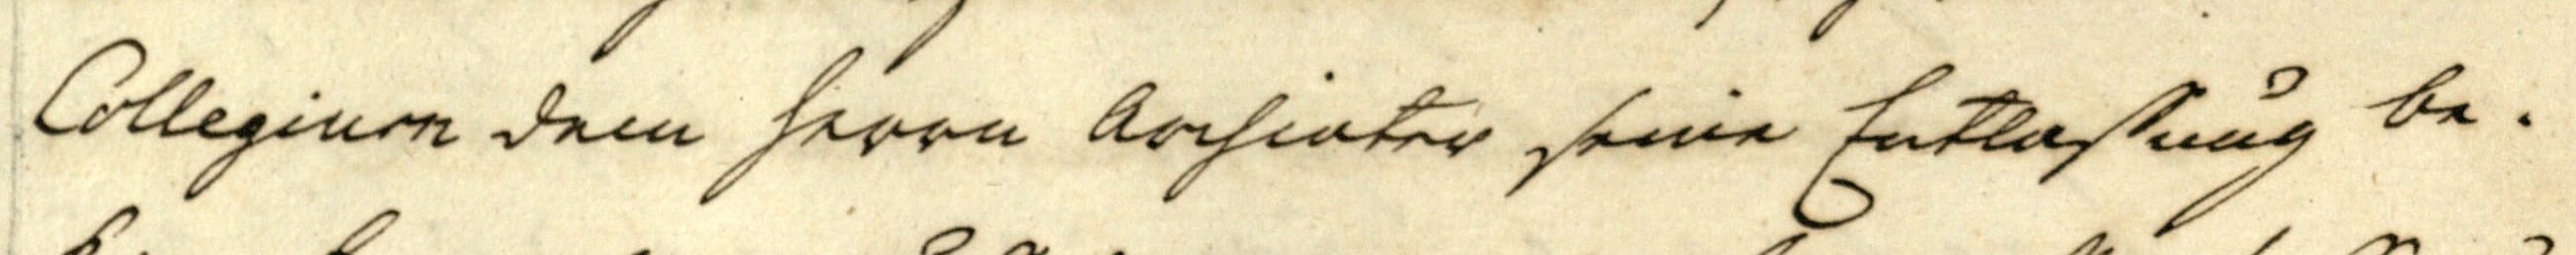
Collegium dem Herrn Archiater seine Entlassung be¬
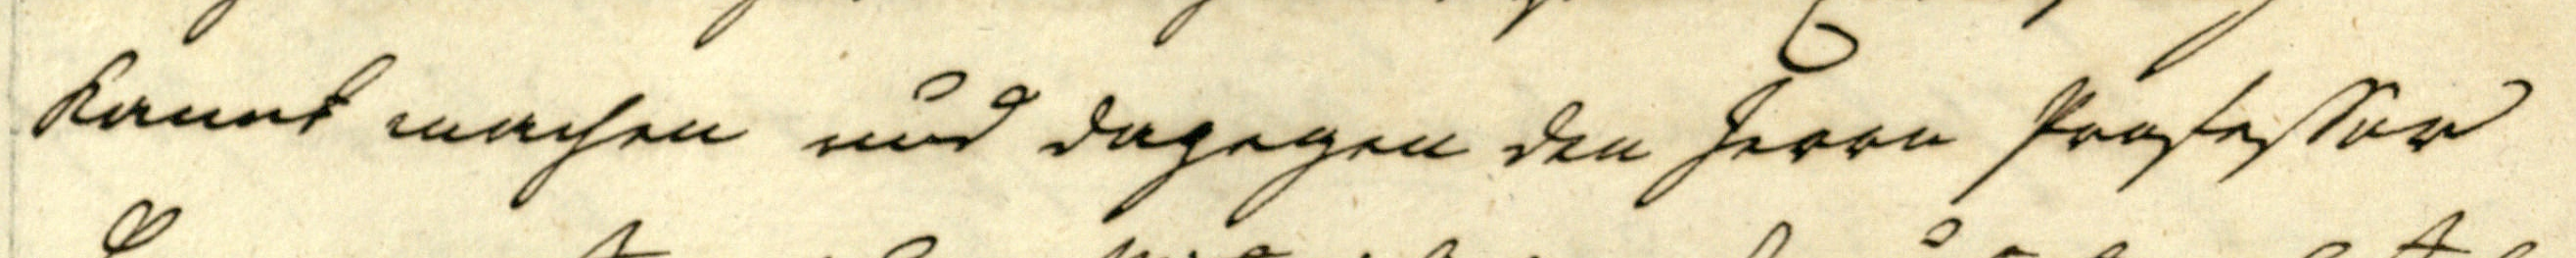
kannt machen und dagegen den Herrn Professor
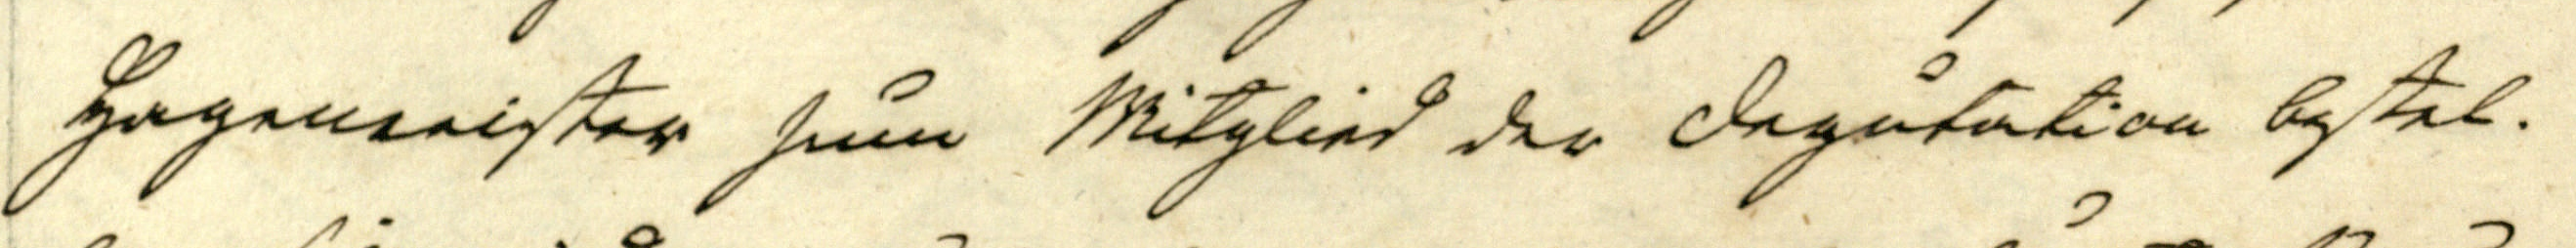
Hagemeister zum Mitglied der Deputation bestel¬
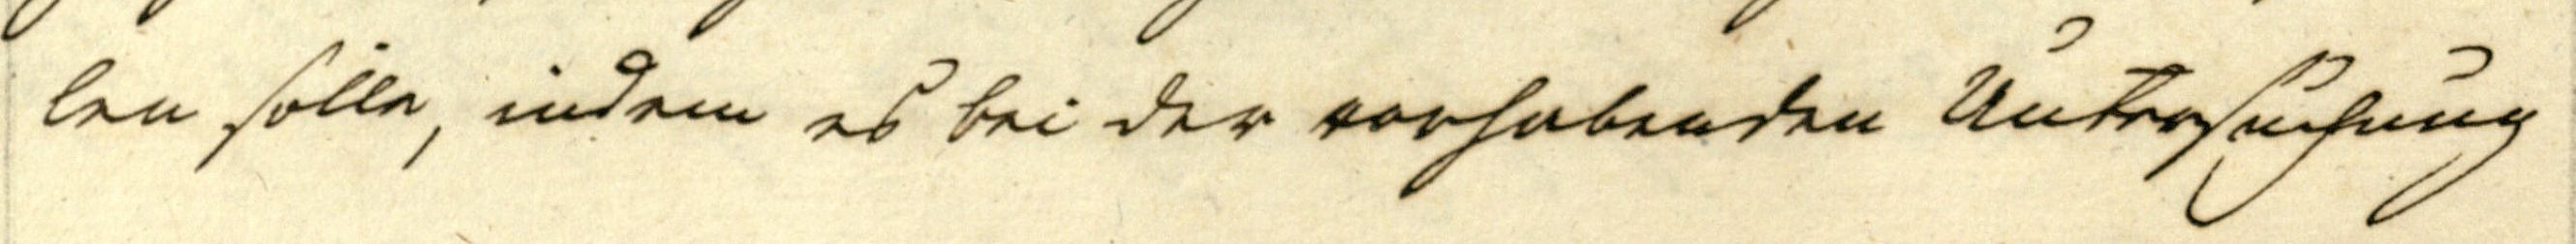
len solle, indem es bei der vorhabenden Untersuchung
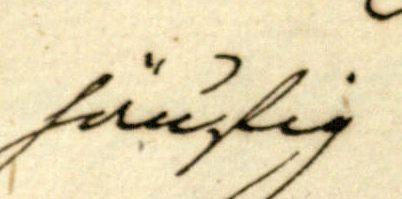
häufig
